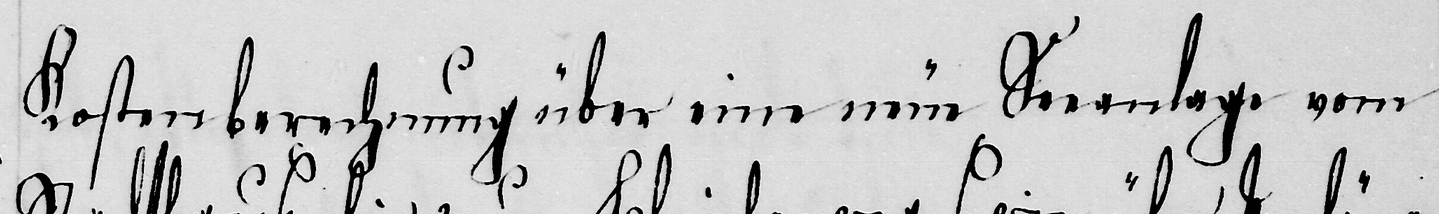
Kostenberechnung über eine neue Seeanlage vom
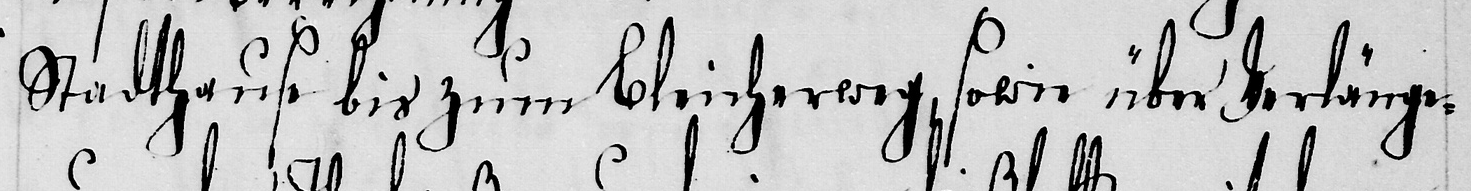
Stadthause bis zum Bleicherweg, sowie über Verlänge¬
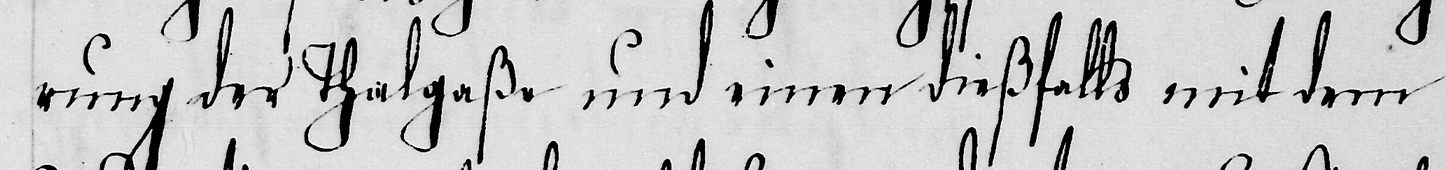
rung der Thalgaße und einen dießfalls mit dem
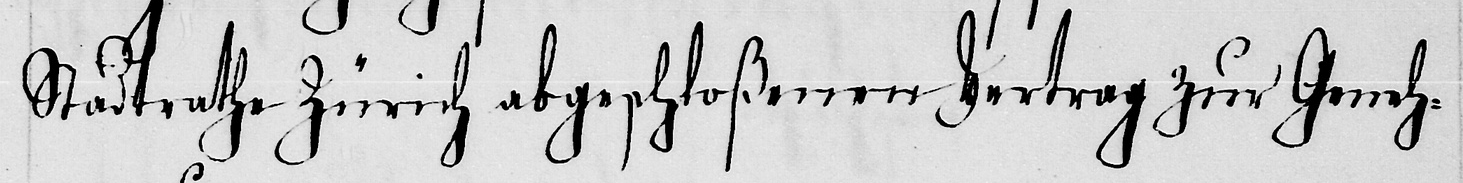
Stadtrathe Zürich abgeschloßenen Vertrag zur Geneh¬
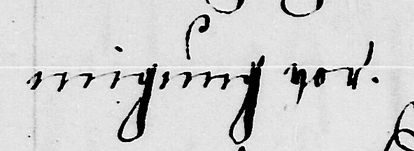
migung vor.
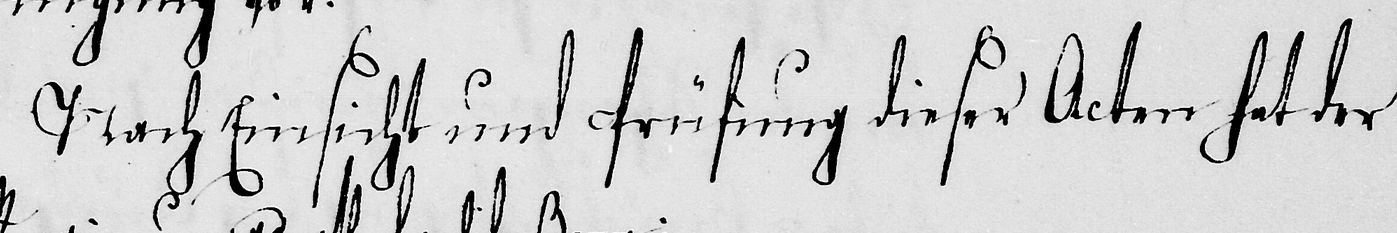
Nach Einsicht und Prüfung dieser Acten hat der
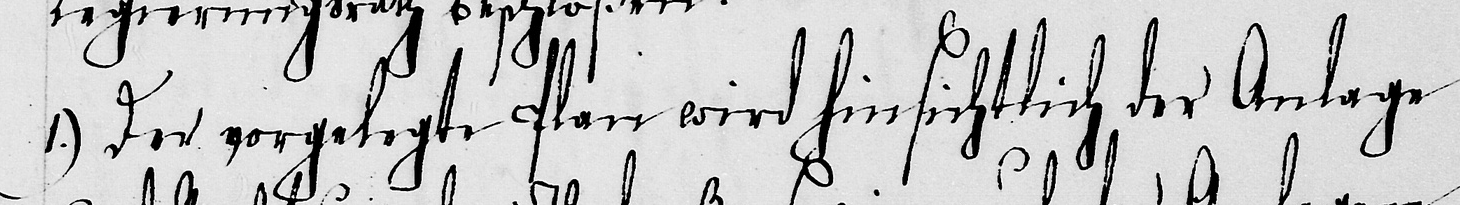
1.) Der vorgelegte Plan wird hinsichtlich der Anlage
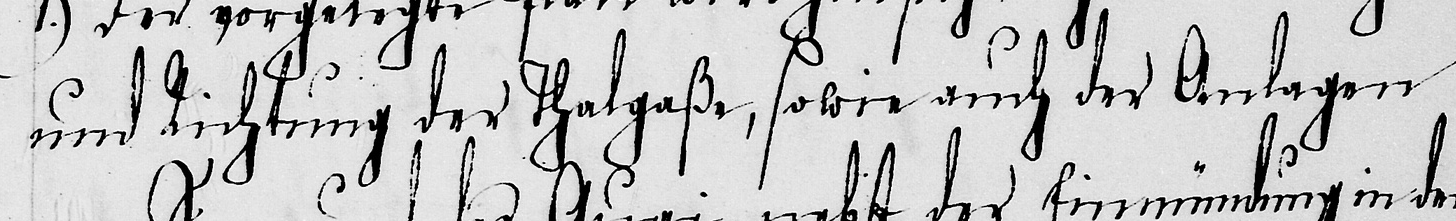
und Richtung der Thalgaße, sowie auch der Anlagen
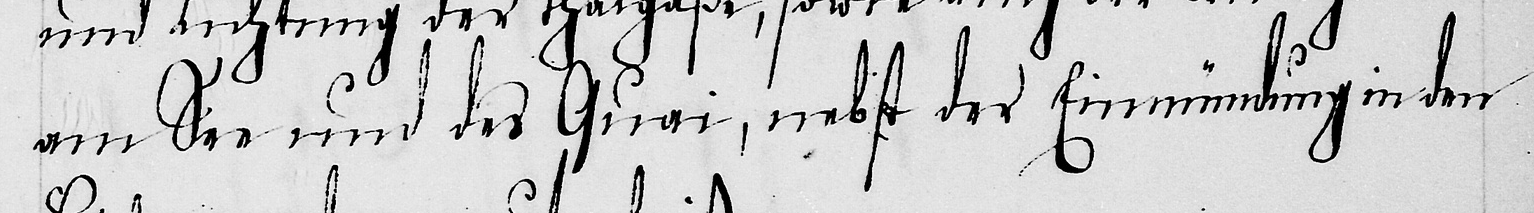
am See und des Quai, nebst der Einmündung in den
